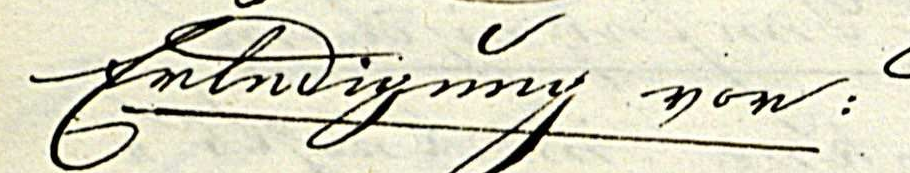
Erledigung vor:
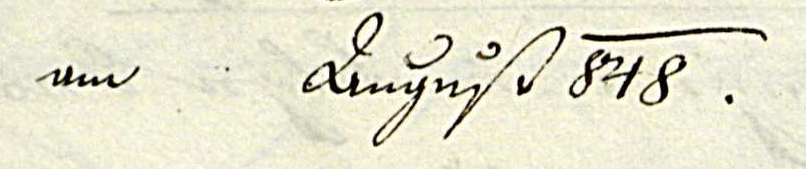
am August 1848
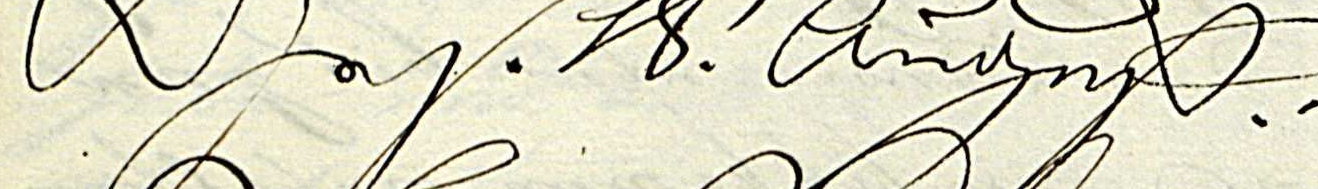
Ges. 18. August
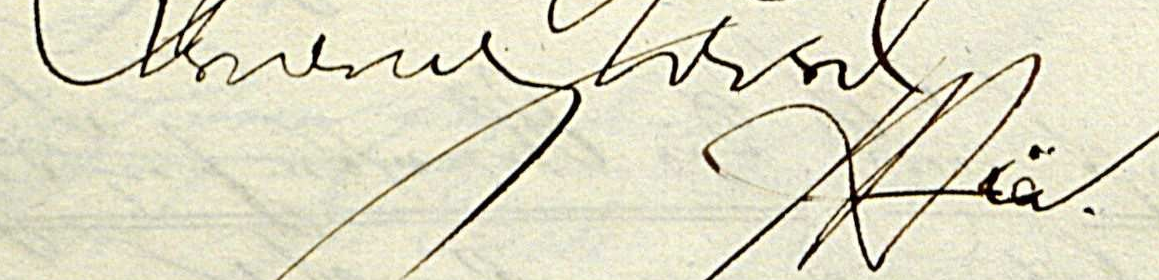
Franz Karl
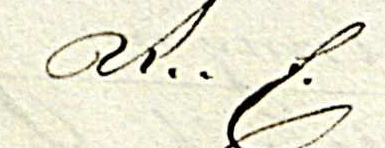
A.E.
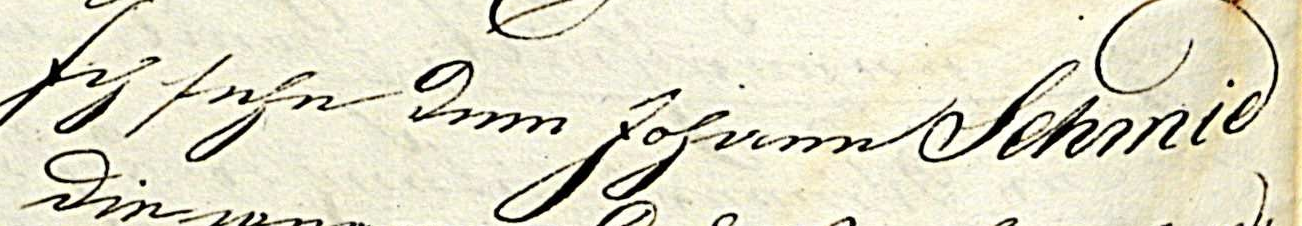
Ich sehe dem Johann Schmid
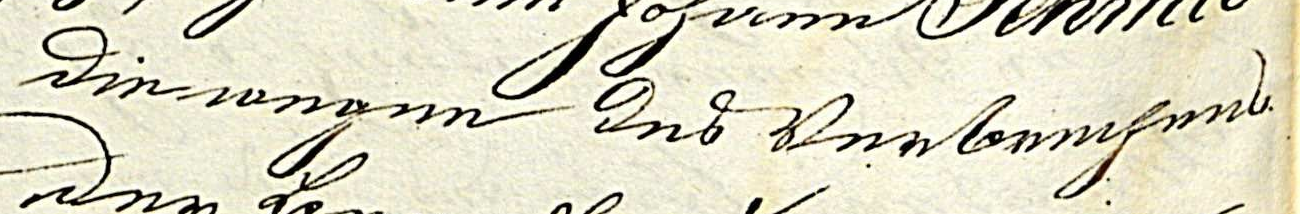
die wegen des Verbrechens
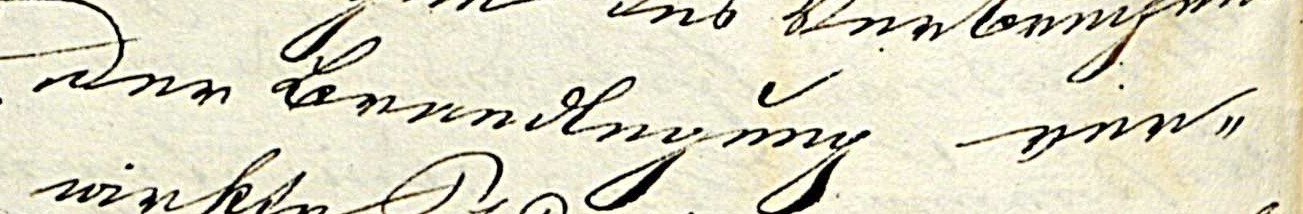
der Brandlegung ver¬
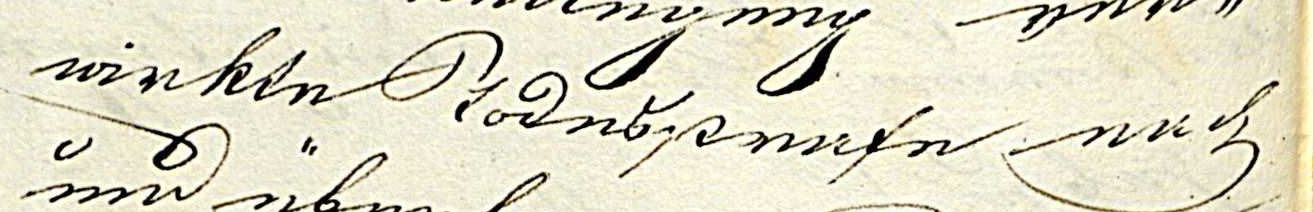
wirkte Todesstrafe nach
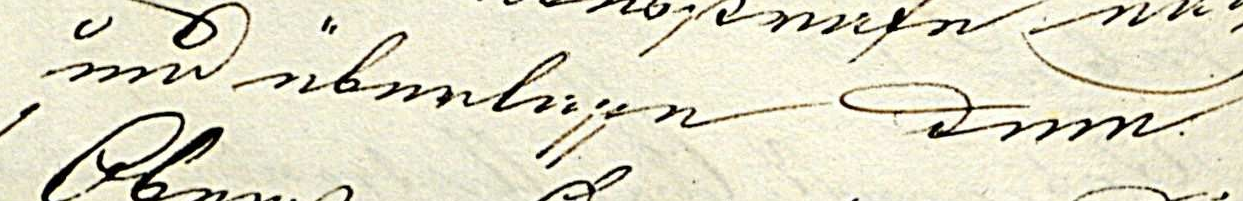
und überlasse dem
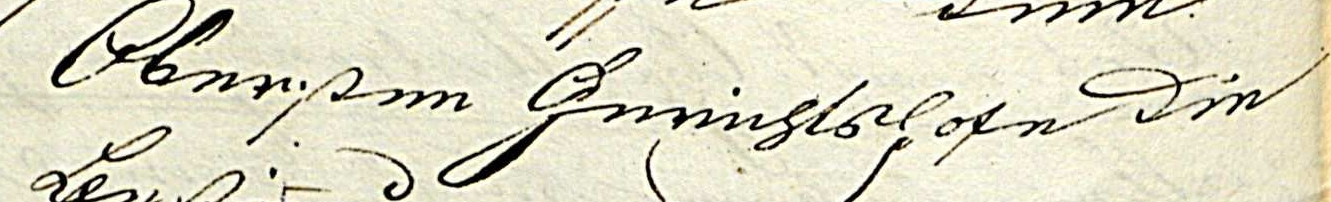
Obersten Gerichtshofe die
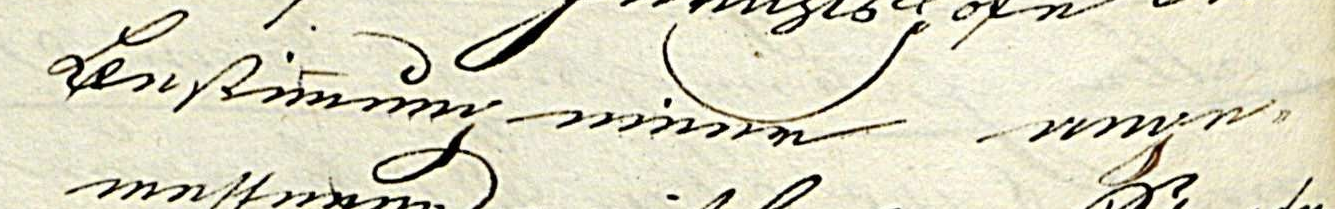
Bestimmung einer ange¬
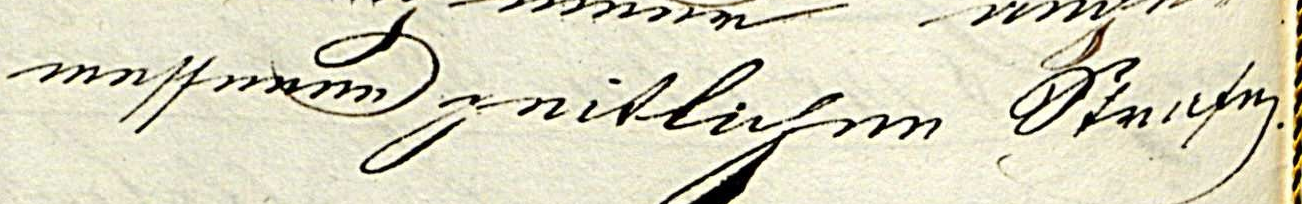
messenen zeitlichen Strafe.
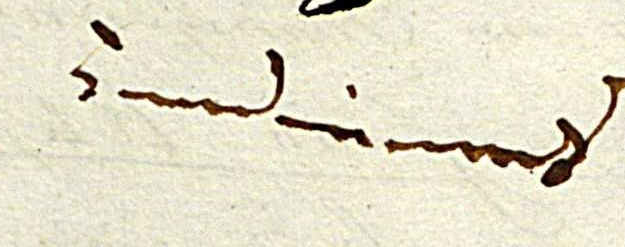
Ferdinand
